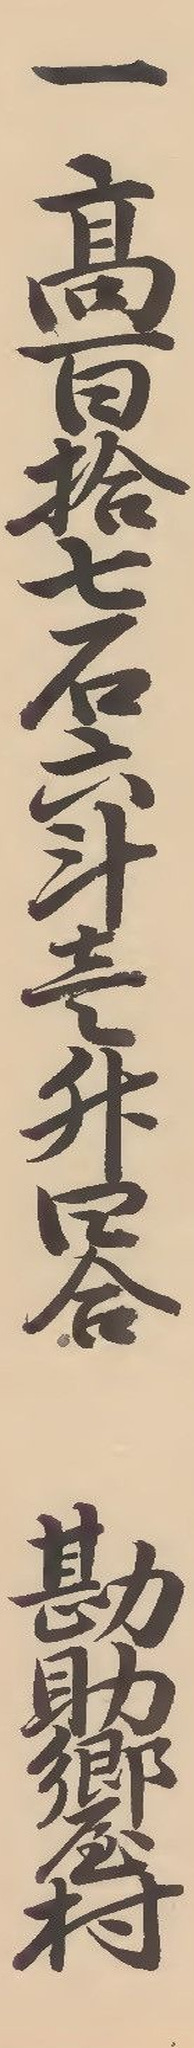一高百拾七石六斗壱升四合勘助郷屋村

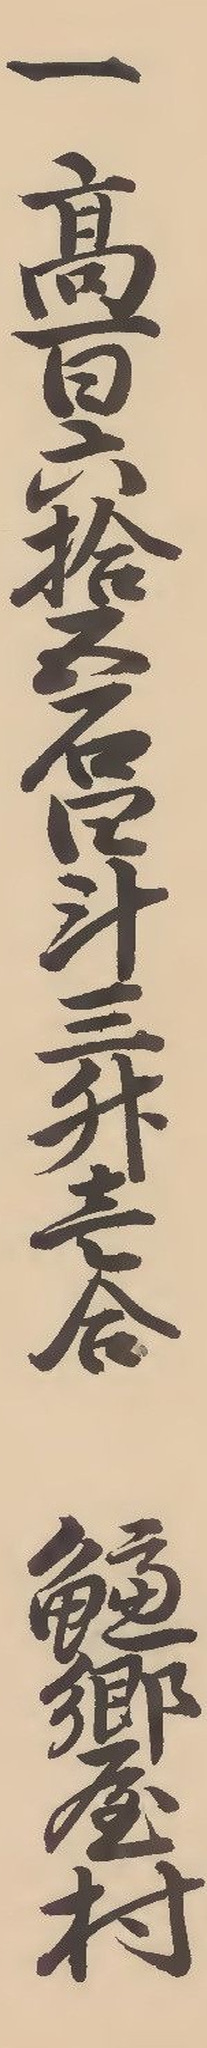一高百六拾五石四斗三升壱合鱸郷屋村
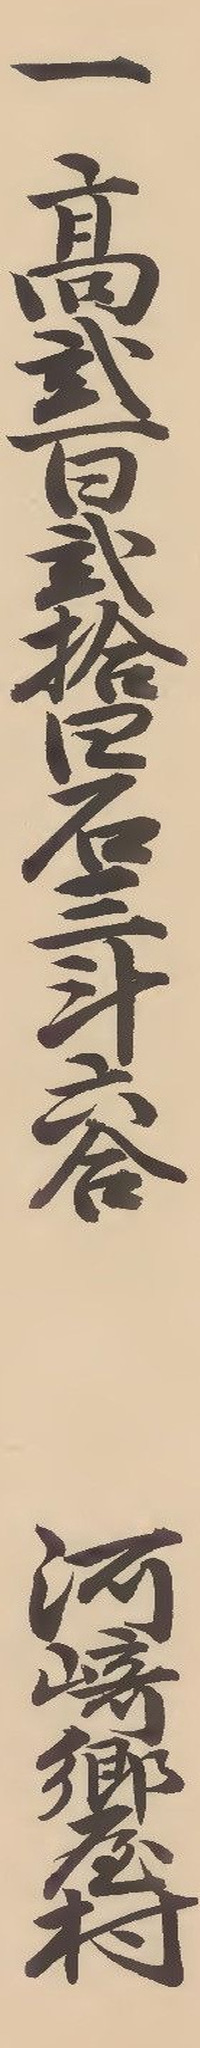一高弐百弐拾四石三斗六合河崎郷屋村
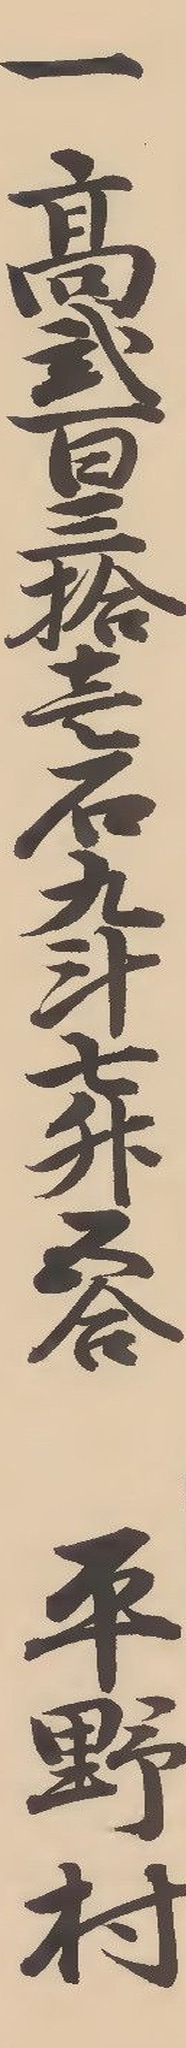一高弐壱百三拾壱石九斗七升五合平野村
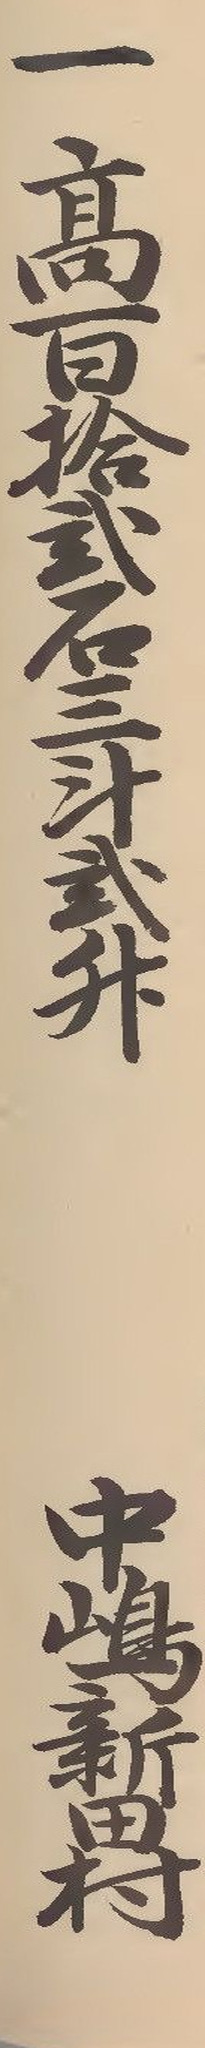一高百拾弐石三斗弐升中島新田村
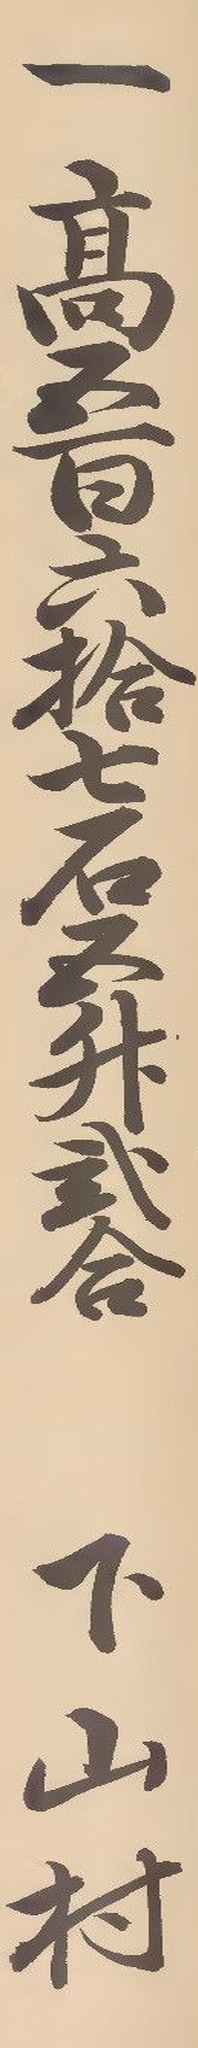一高五百六拾七石五升弐合下山村
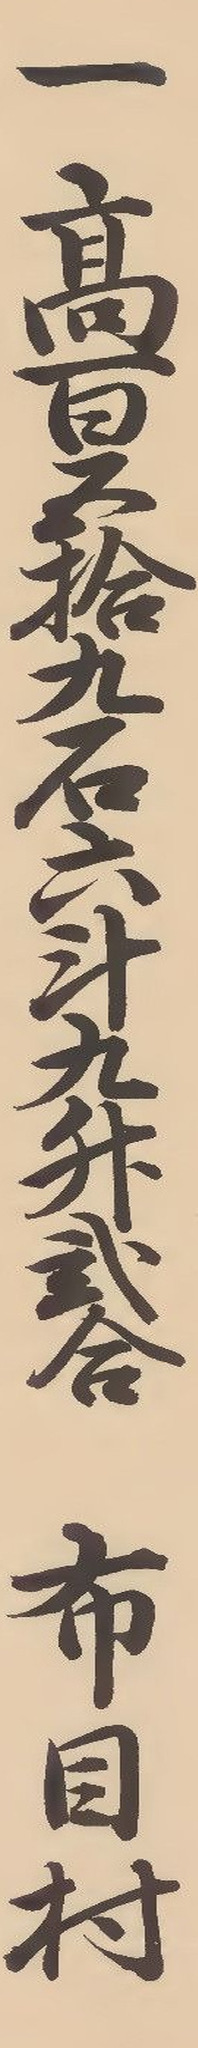一高百五拾九石六斗九升弐合布目村
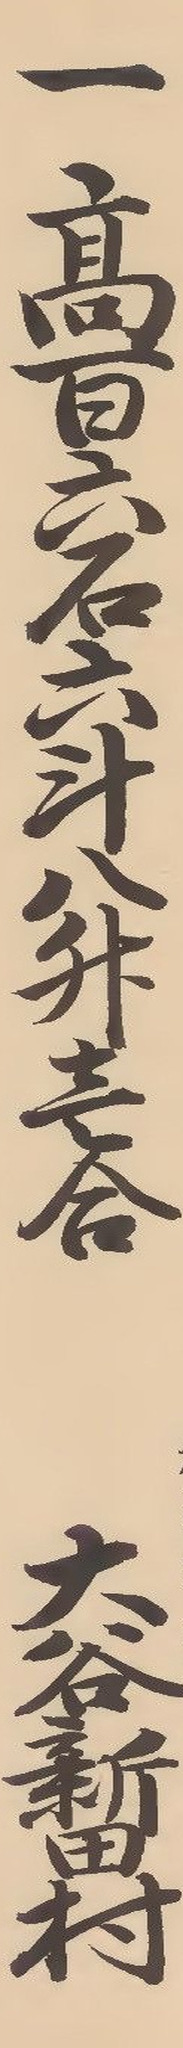一高百六石六斗八升壱合大谷新田村
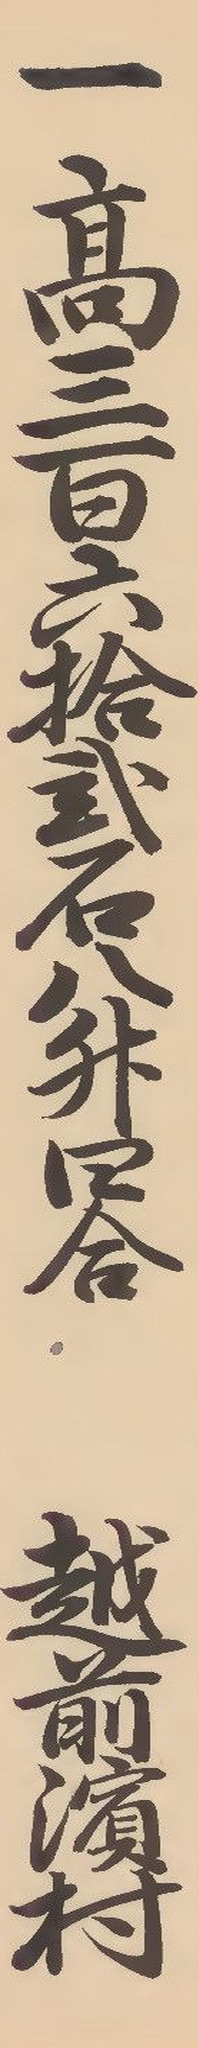一高三百六拾弐石八升四合越前浜村

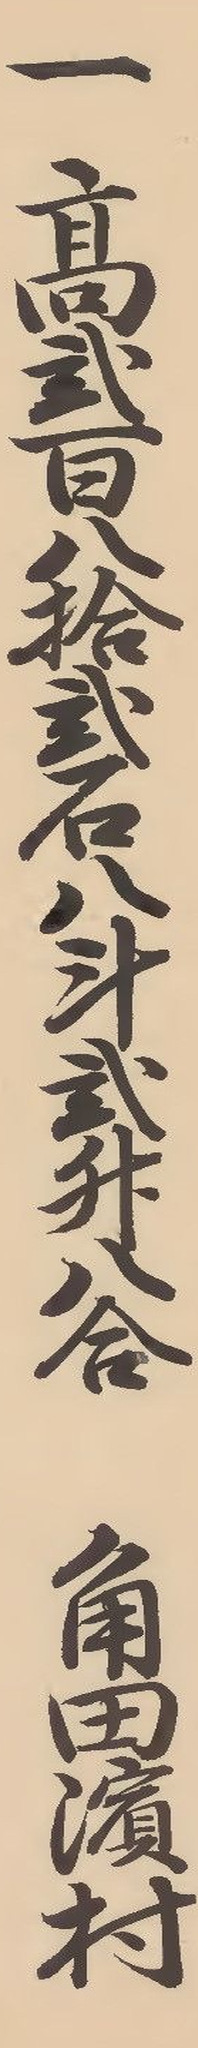一高弐百八拾弐石八斗弐升八合角田浜村
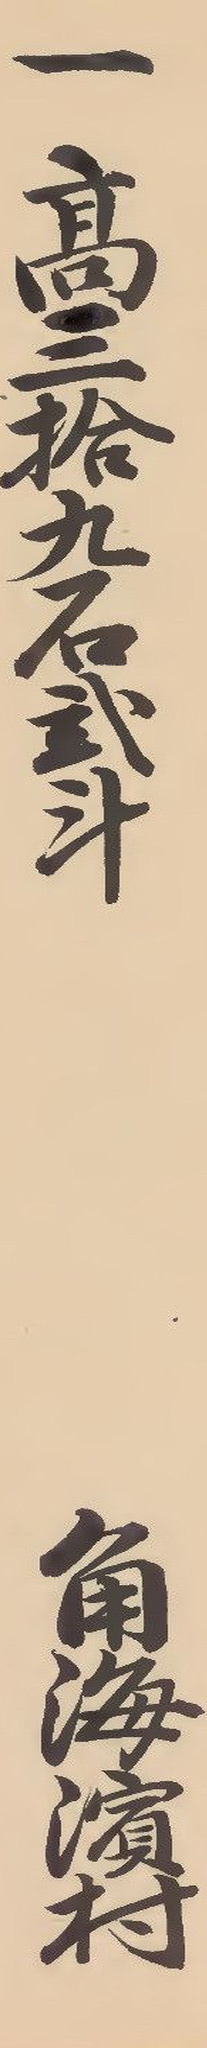一高三拾九石弐斗角海浜村
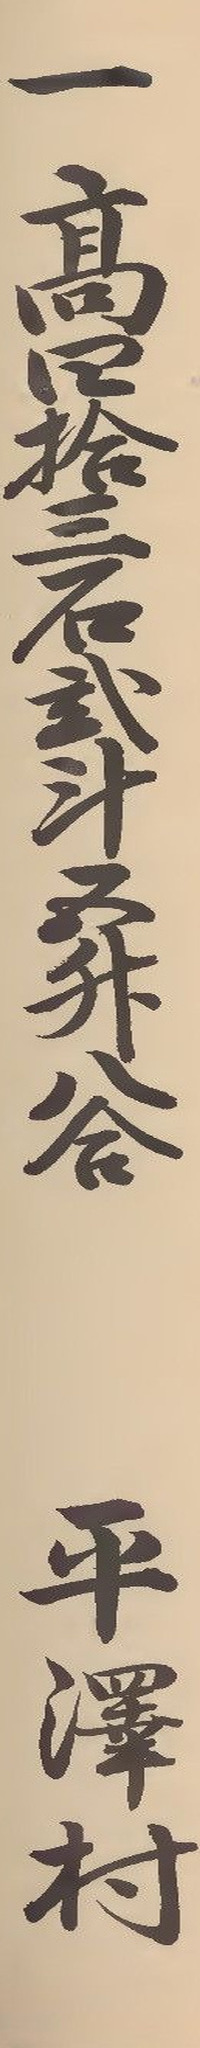一高四拾三石弐斗五升八合平沢村
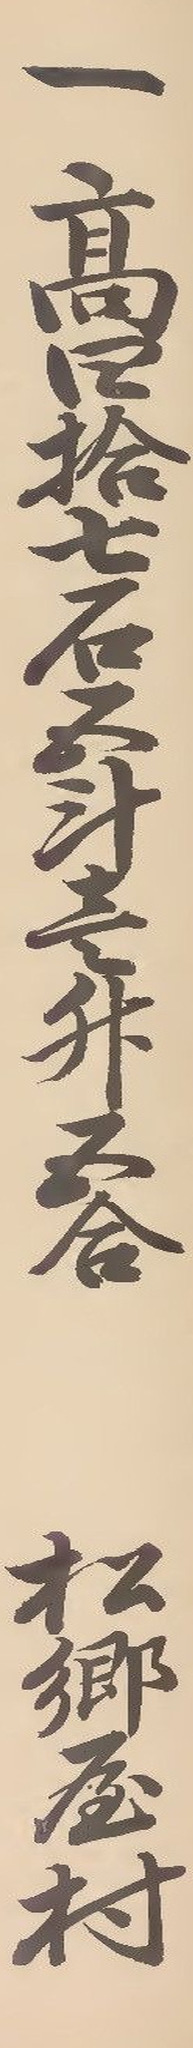一高四拾七石五斗壱升五合松郷屋村
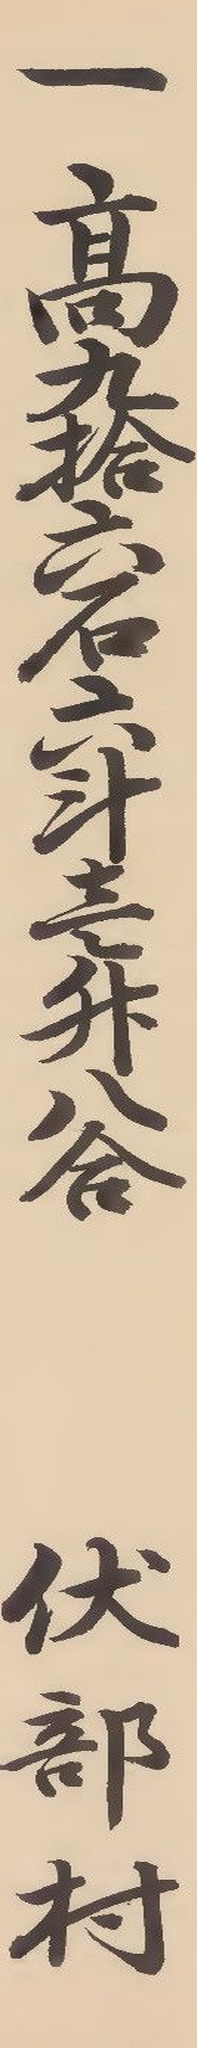一高九拾六石六斗壱升八合伏部村
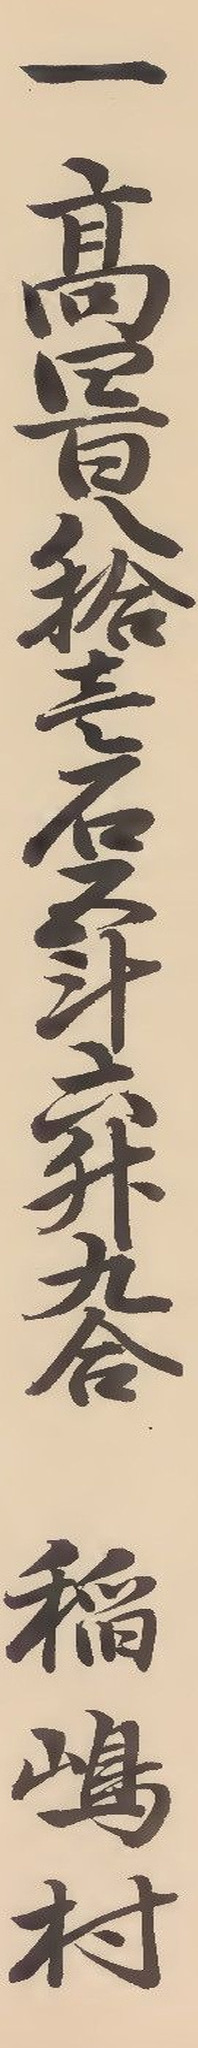一高四百八拾壱石五斗六升九合稲島村
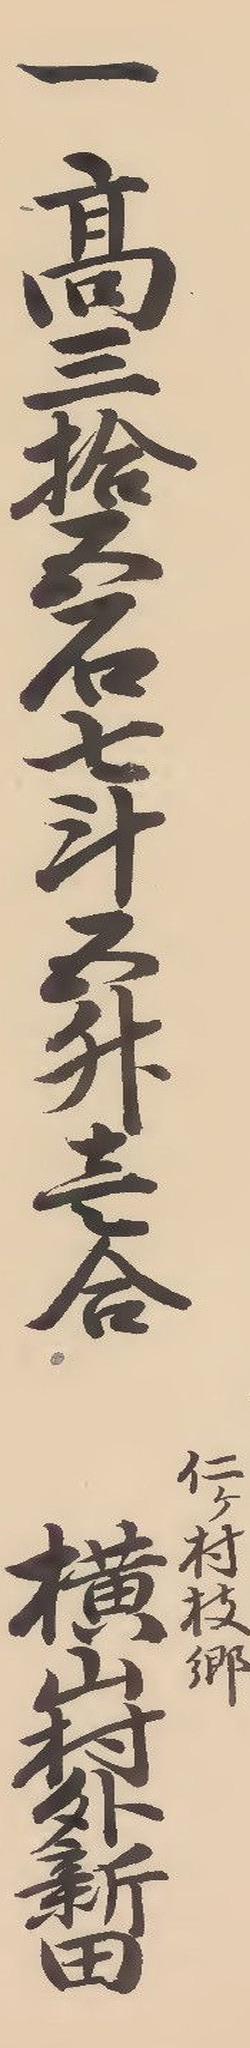一高三拾五石七斗五升壱合横山村外新田
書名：越後国郷帳　下
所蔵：国立公文書館 National Archives of Japan
